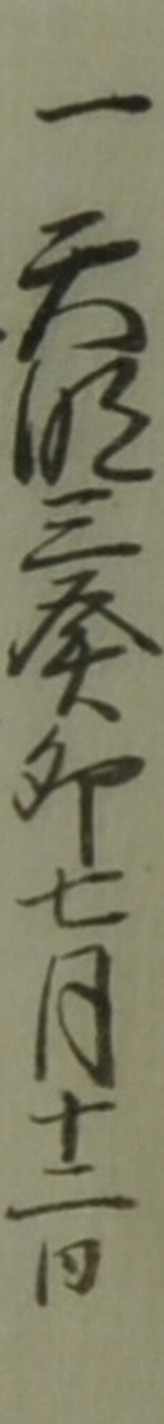一天明三癸卯七月十二日
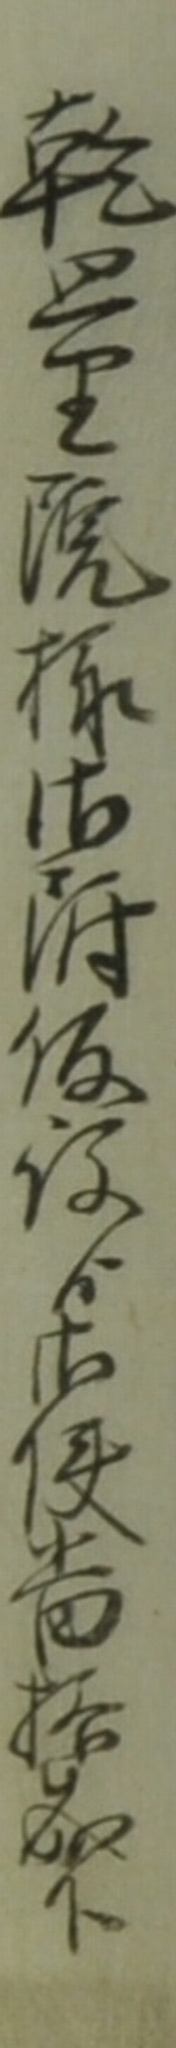乾量院様御附仮役ゟ御使番格成下
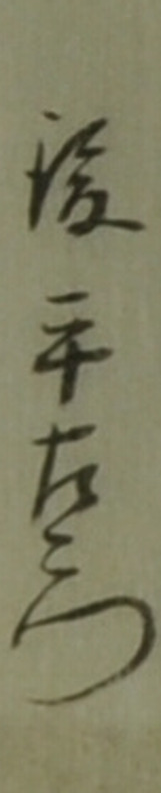後平左衛門

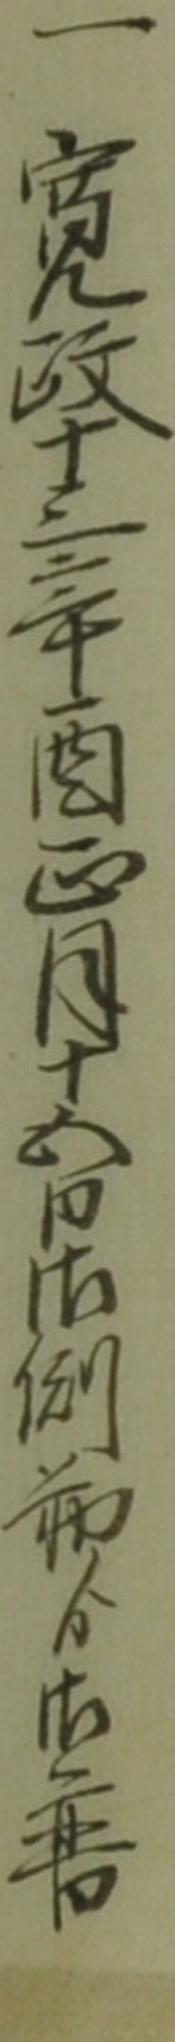一寛政十三辛酉正月十五日御側勤ゟ御普
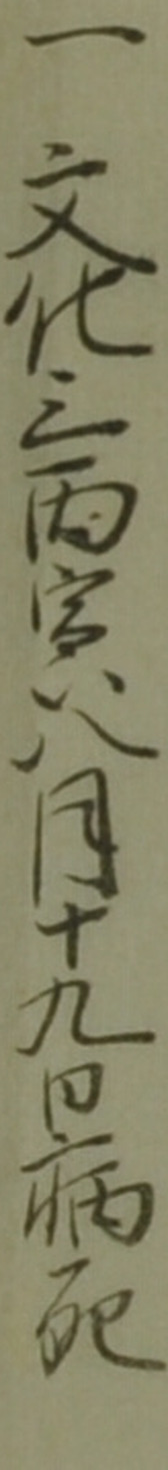一文化三丙寅八月十九日病死
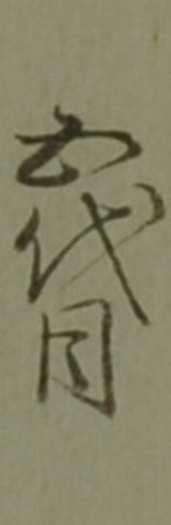五代目
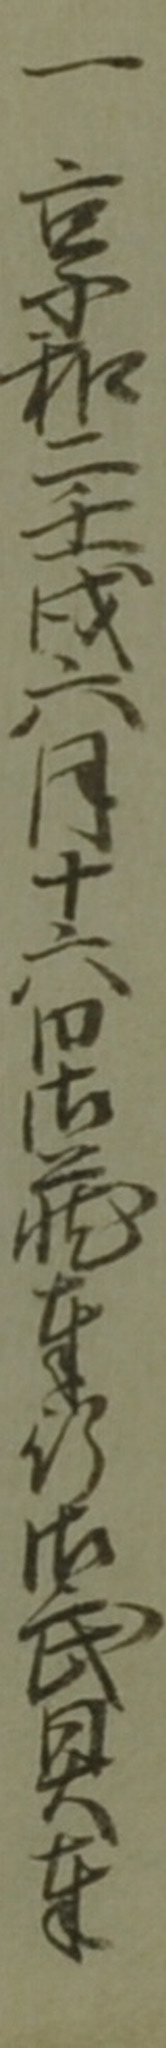一享和二壬戌六月十六日御蔵奉行御武具奉
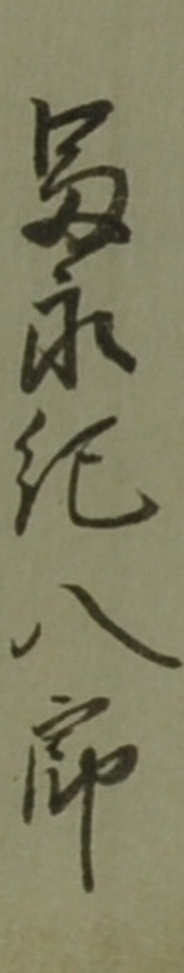冨永紀八郎
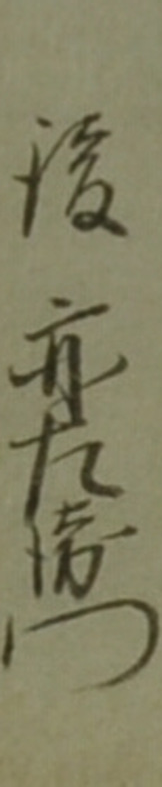後亦左衛門
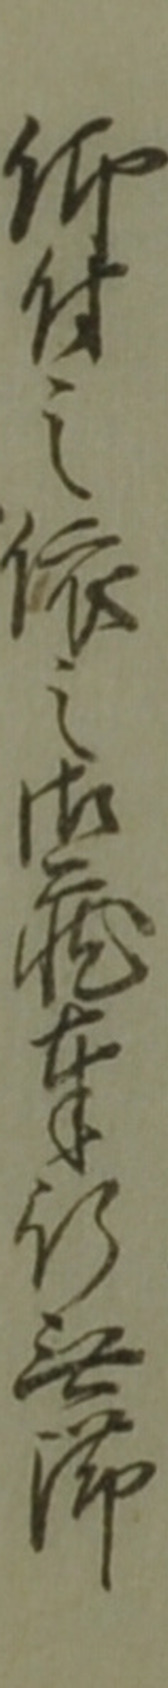仰出之依之御蔵奉行無滞
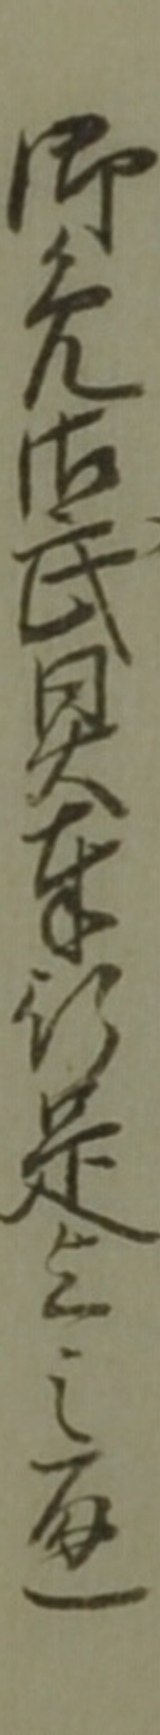御免御武具奉行是迄之通
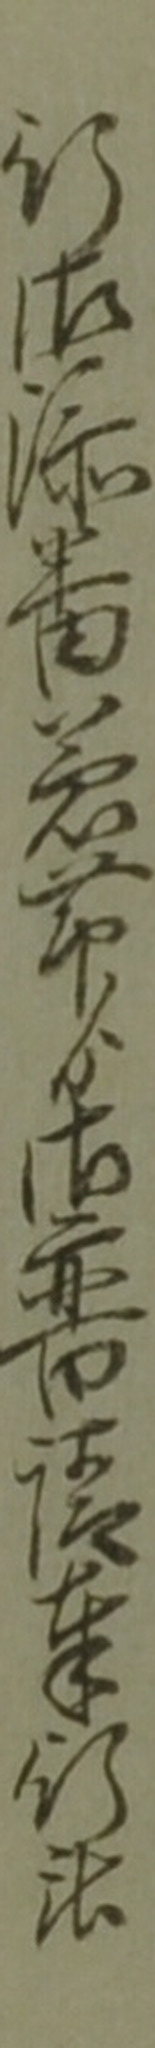行御添番兼帯ゟ御普請奉行被
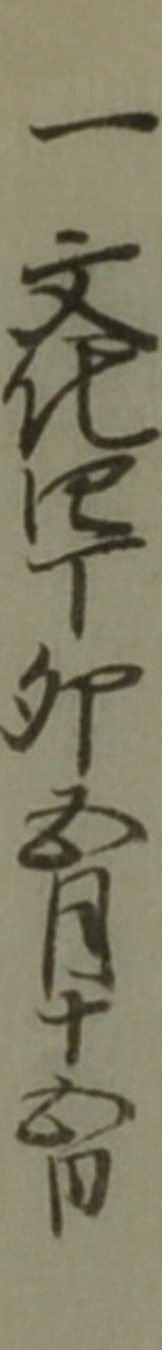一文化四丁卯五月十五日
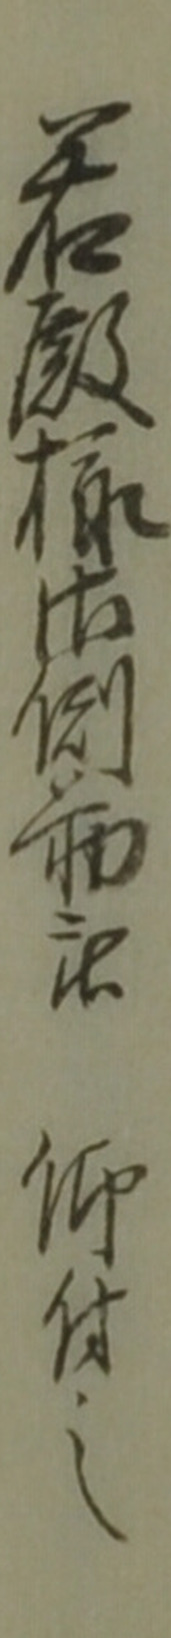若殿様御側勤被仰付之
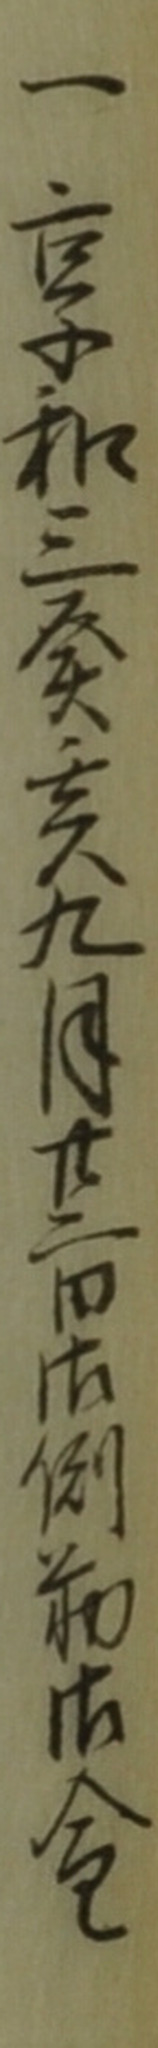一享和三癸亥九月廿二日御側勤御金
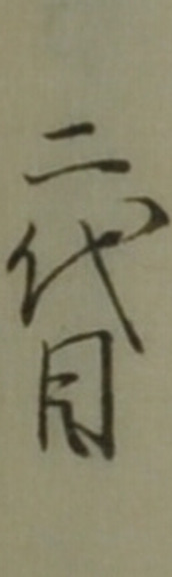二代目
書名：諸御役代々録（六）
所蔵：伊那市立高遠町図書館・合同会社AMANE
